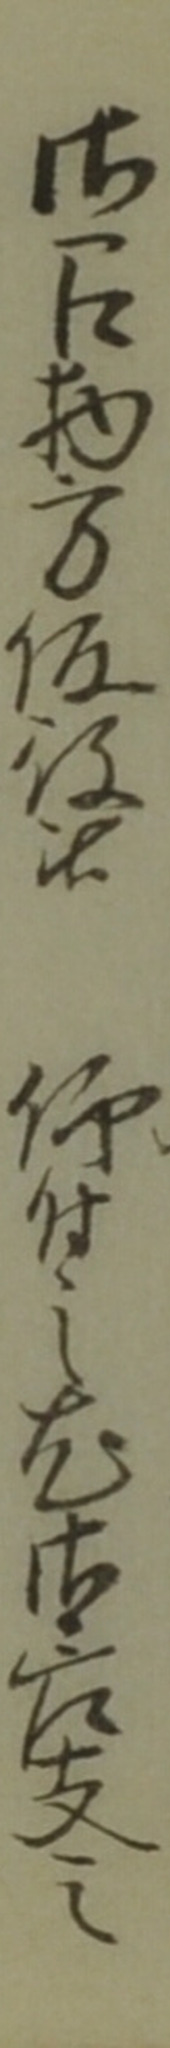御召物方仮役被仰付之尤御差支
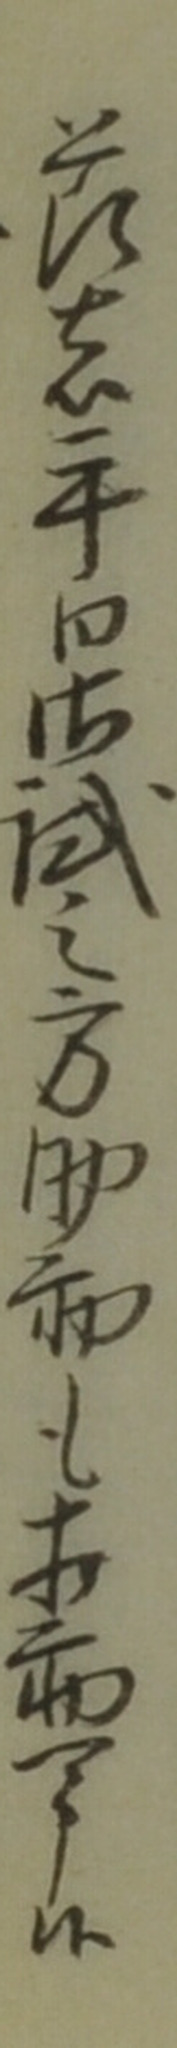節者平日御試之方助勤も相勤可申候
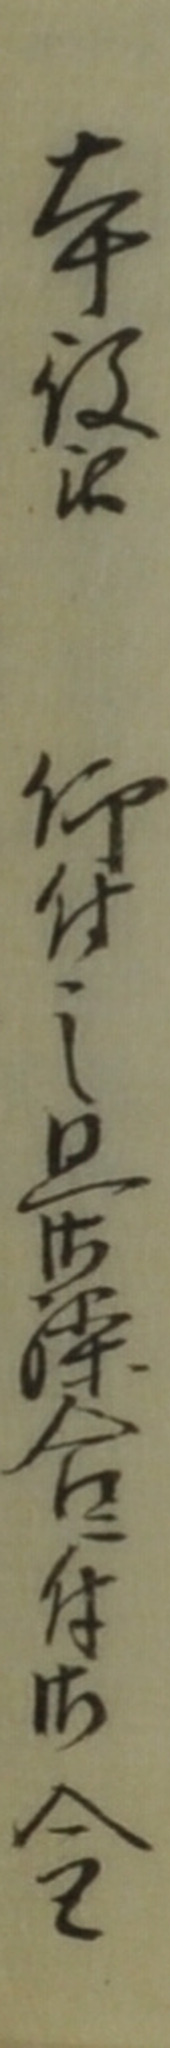本役被仰付之且御繰合ニ付御金
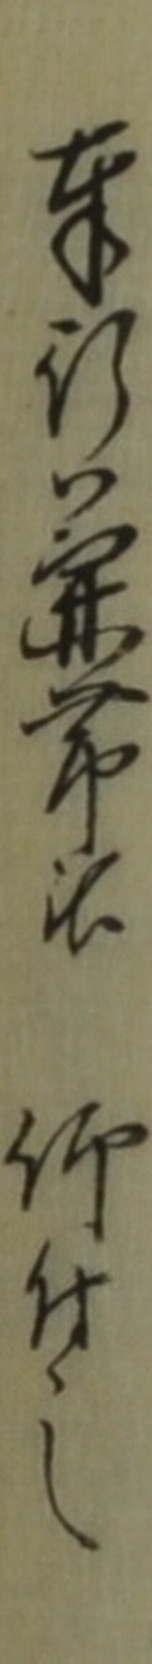奉行兼帯被仰付之
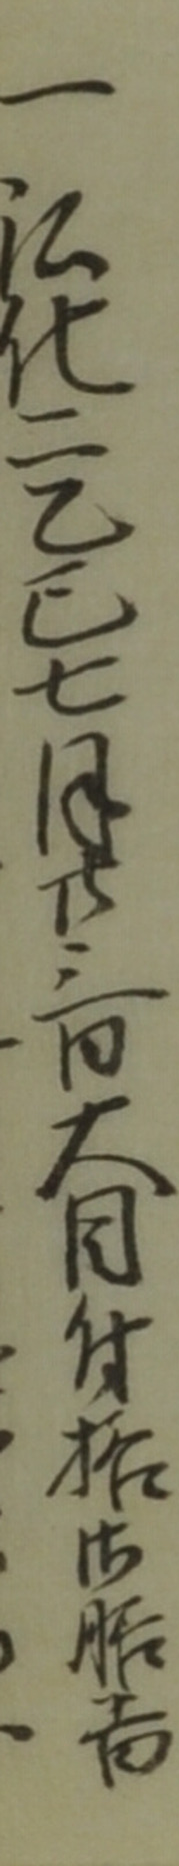一弘化二乙巳七月廿三日大目付格御膳番
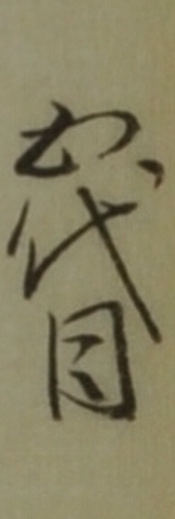五代目
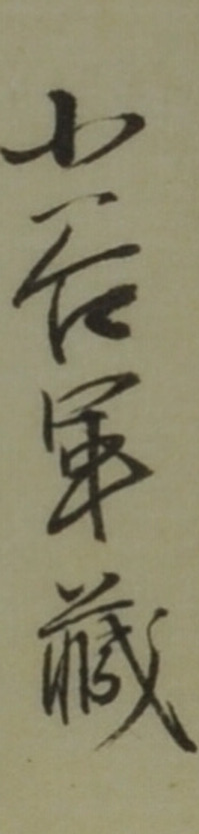小谷軍蔵
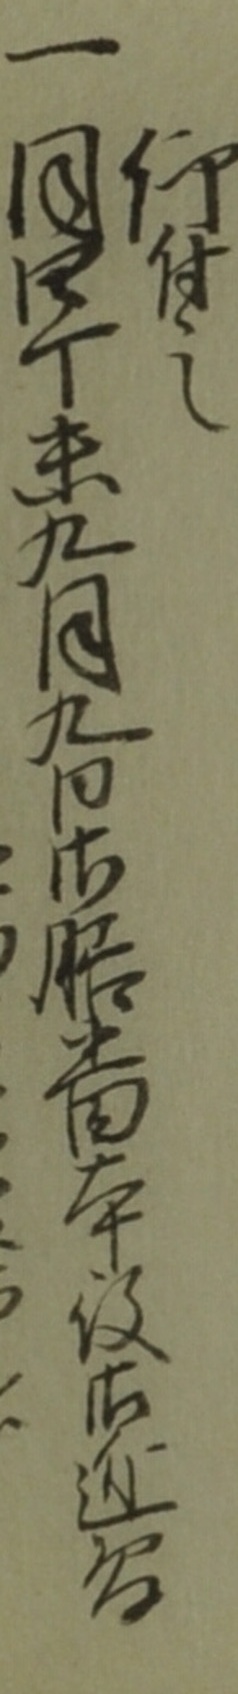一同四丁未九月九日御膳番本役御近習
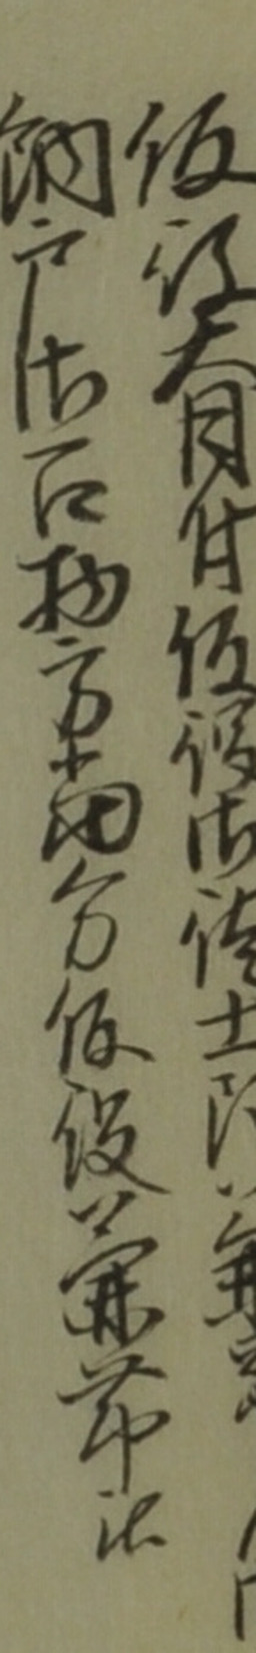納戸御召物方当分仮役兼帯被
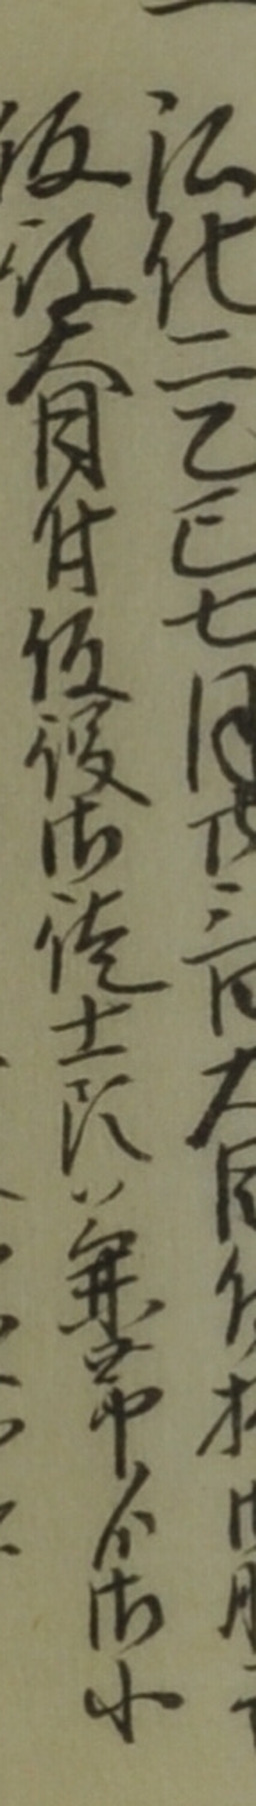仮役大目付仮役御徒士頭兼帯ゟ御小
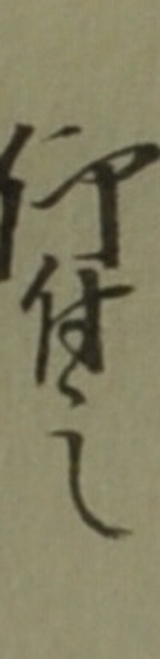仰付之
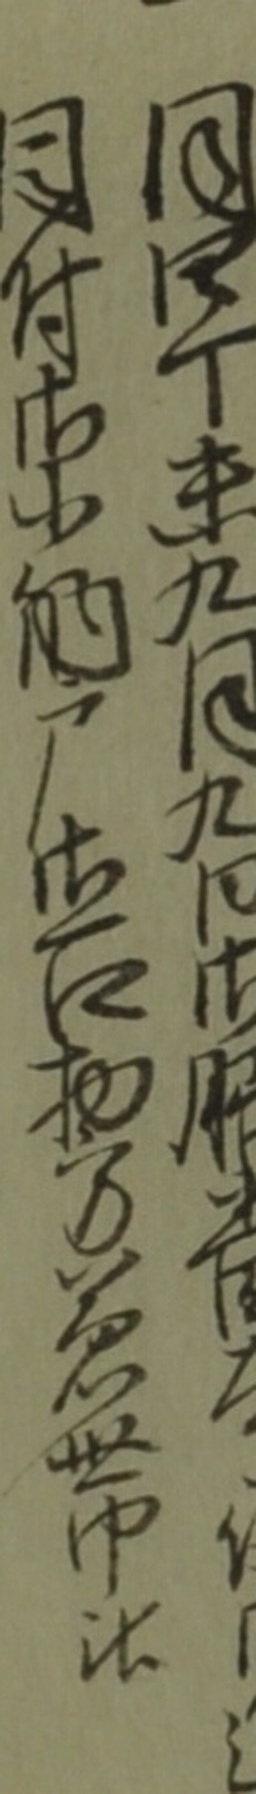目付御小納戸御召物方兼帯被
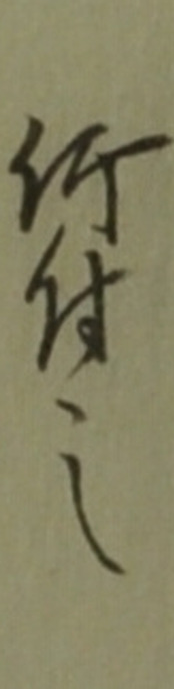仰付之
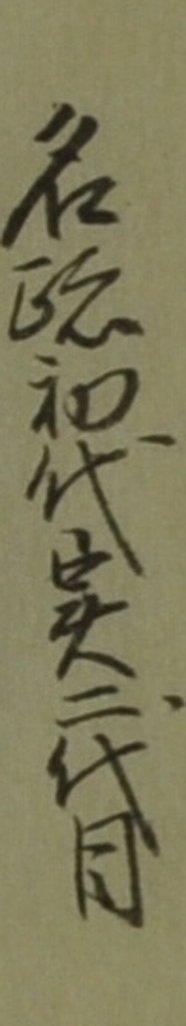名跡初代実に代目
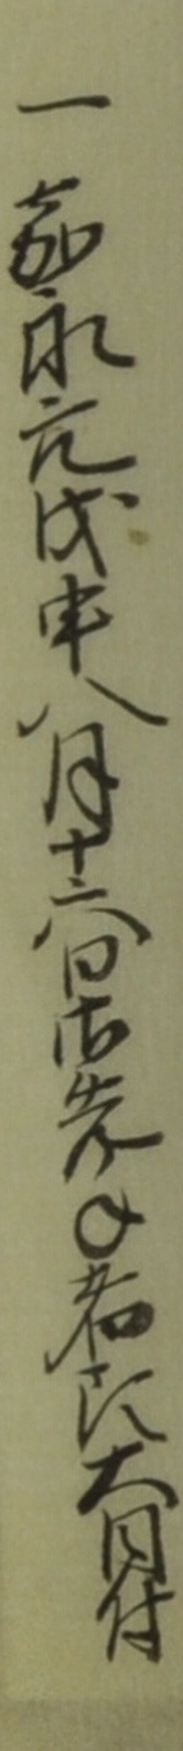一嘉永元戊申八月十六日御先手者頭大目付
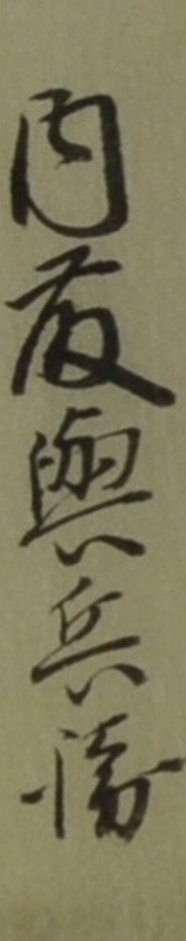内藤与兵衛
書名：諸御役代々録（四）
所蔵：伊那市立高遠町図書館・合同会社AMANE
